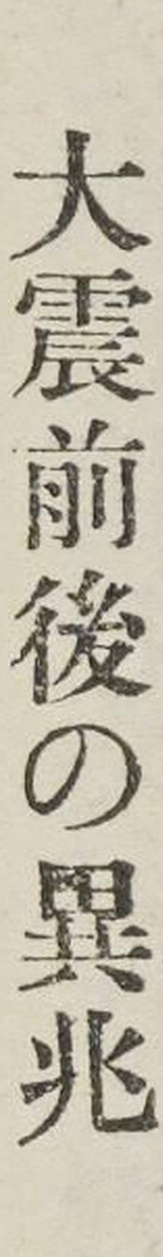大震前後の異兆
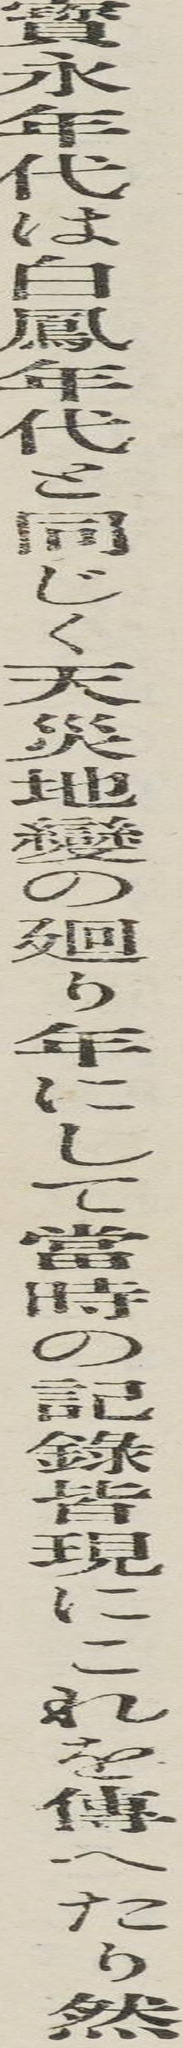宝永年代は白鳳年代と同じく天災地変の廻り年にして当時の記録皆現にこれを伝へたり然
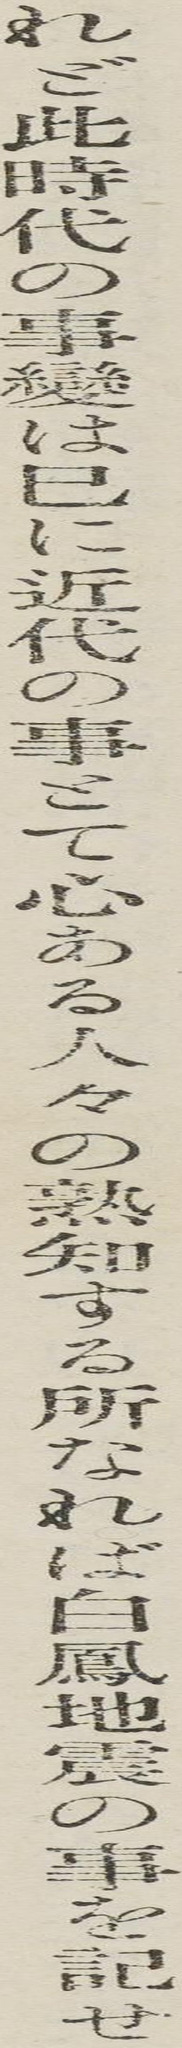れど此時代の事変は已に近代の事とて心ある人々の熟知する所なれば白鳳地震の事を記せ
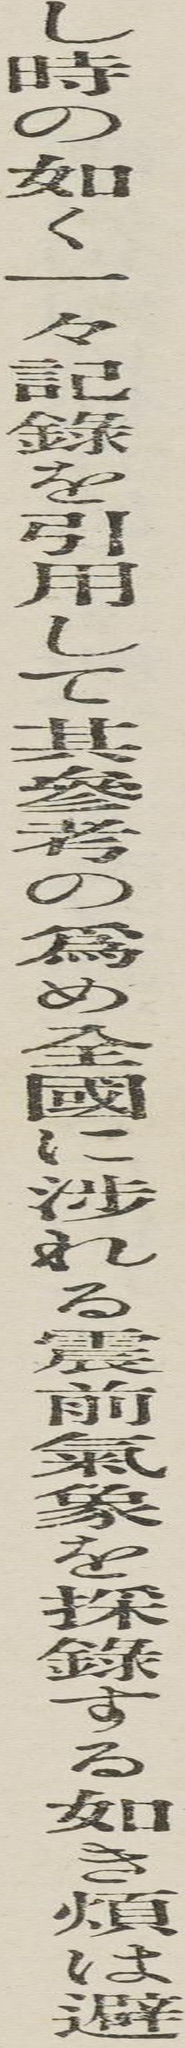し時の如く一々記録を引用して其参考の為め全国に渉れる震前気象を採録する如き煩は避
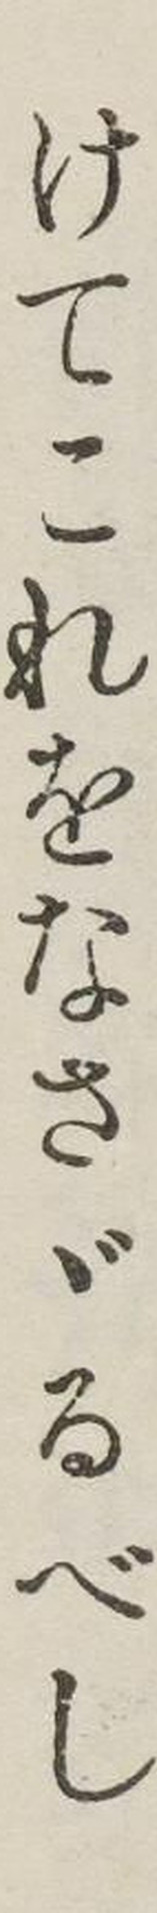けてこれをなさゞるべし
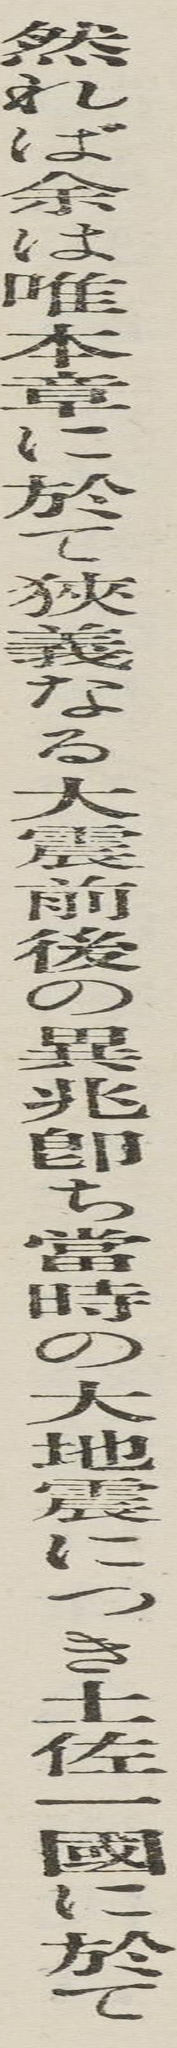然れば余は唯本章に於て狭義なる大震前後の異兆即ち当時の大地震につき土佐一国に於て
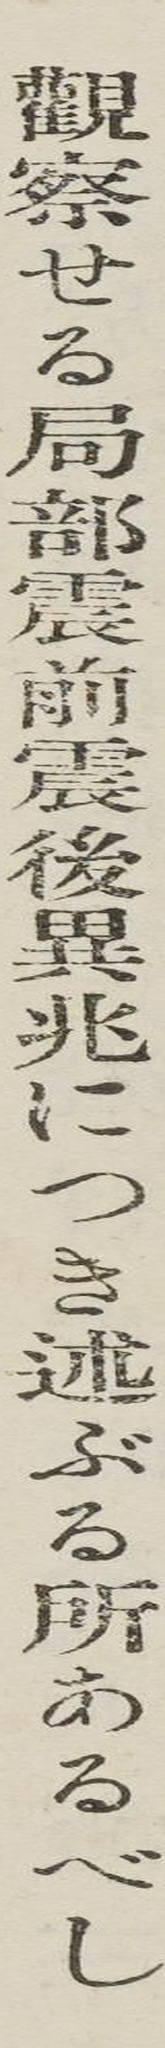観察せる局部震前震後異兆につき述ぶる所あるべし
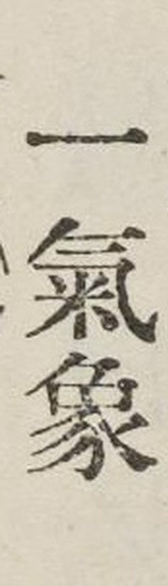㈠気象
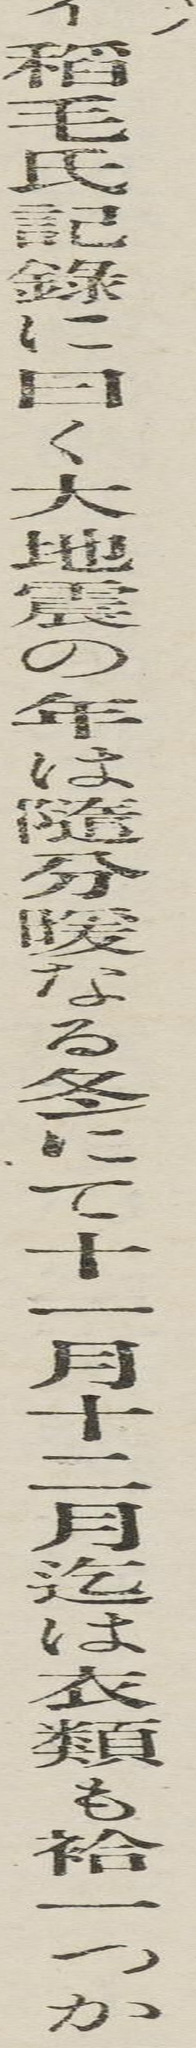稲毛氏記録に曰く大地震の年は随分暖なる冬にて十一月十二日迄は衣類も袷一つか
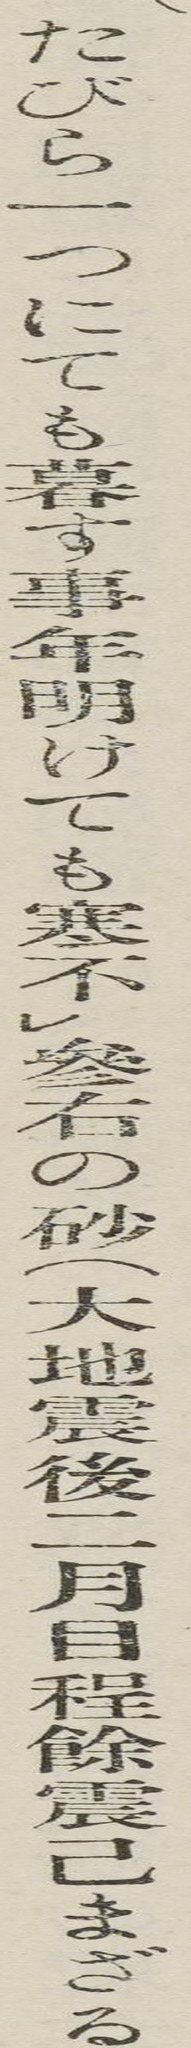たびら一つにても暮す事年明けても寒不参右の砂（大地震後二月目程余震已まざる
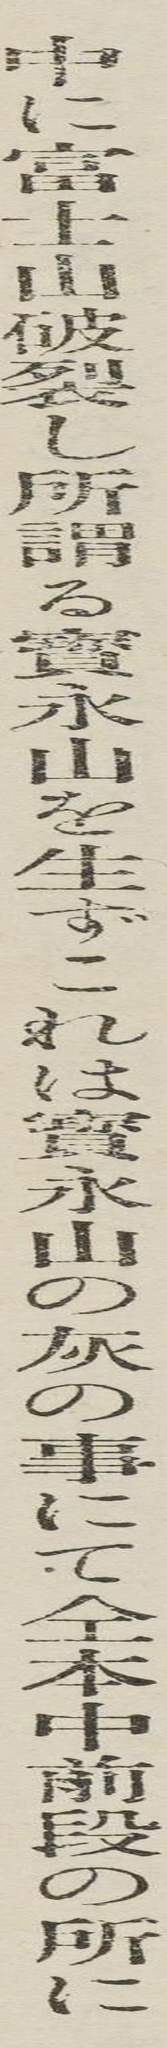中に富士山破裂し所謂る宝永山を生ずこれは宝永山の灰の事にて同本中前段の所に
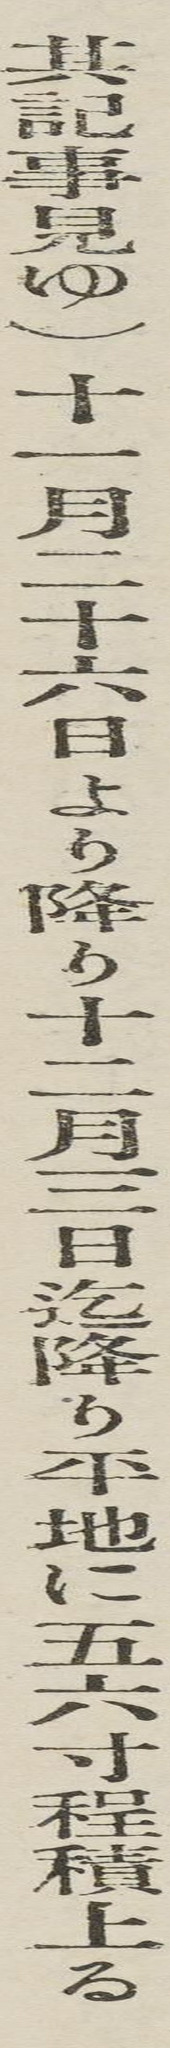其記事見ゆ）十二月二十六日より降り十二月三日迄降り平地に五六寸程積上る
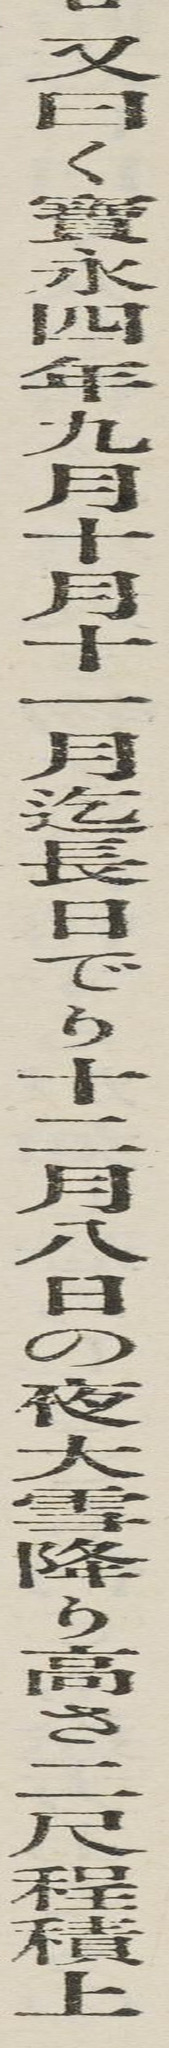又曰く宝永四年九月十月十一月迄長日でり十二月八日の夜大雪降り高さ二尺程積上
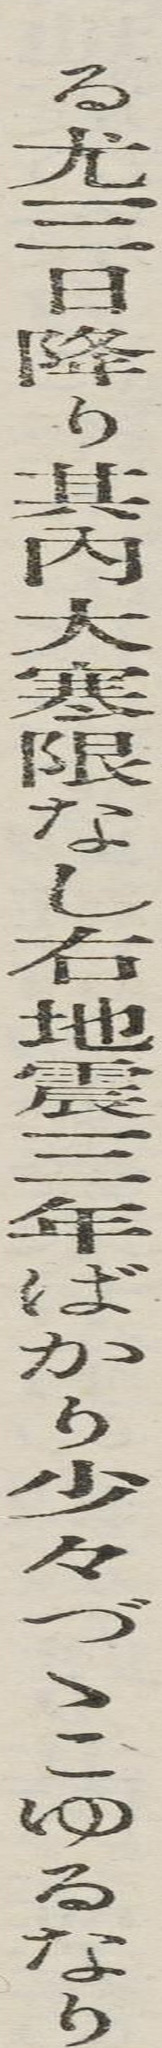る尤三日降り其内大寒限りなし右地震三年ばかり少々づゝこゆなり
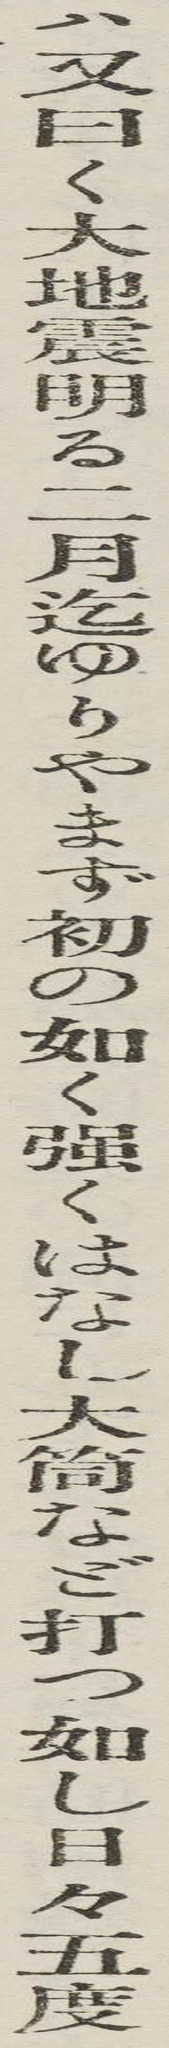又曰く大地震明る二月迄ゆりやまず初の如く強くはなし大筒など打つ如し日々五度
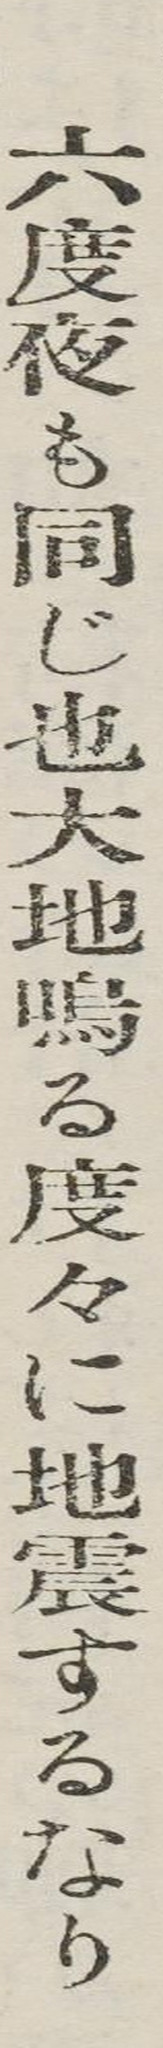六度夜も同じ也大地鳴る度々に地震するなり
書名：土佐古今ノ地震
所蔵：東京大学地震研究所図書室 Earthquake Research Institute Library, The University of Tokyo, JAPAN
